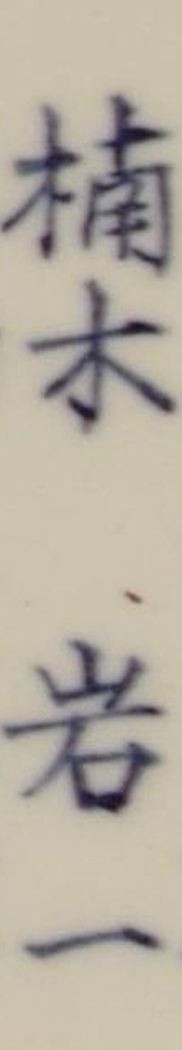楠木岩一
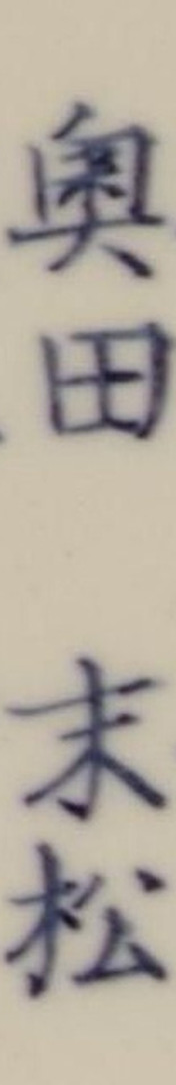奥田末松
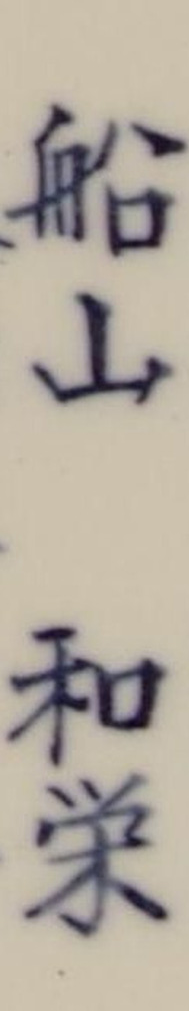船山和栄
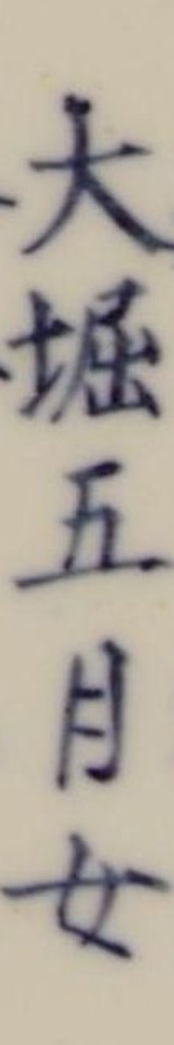大堀五月女
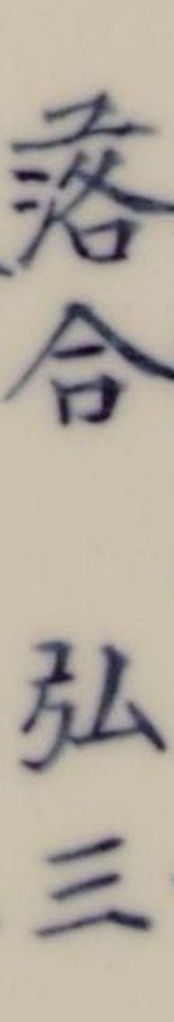落合弘三
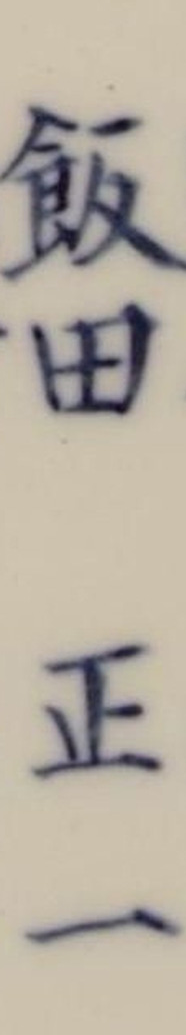飯田正一
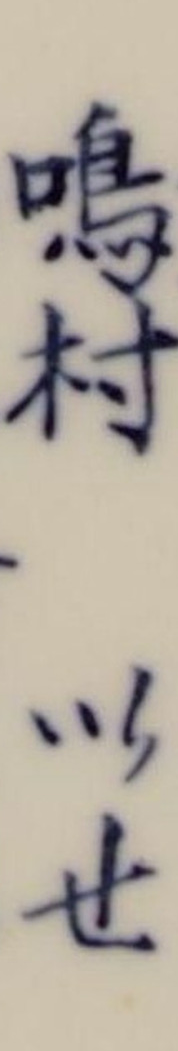鳴村いせ
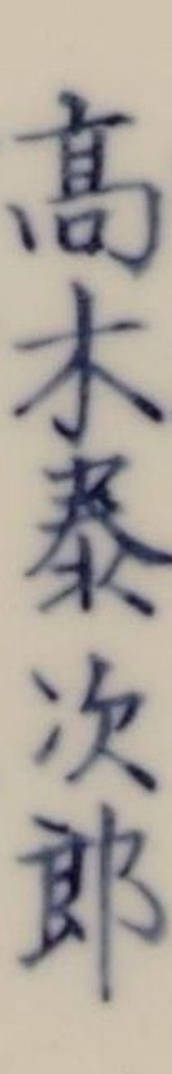高木泰次郎
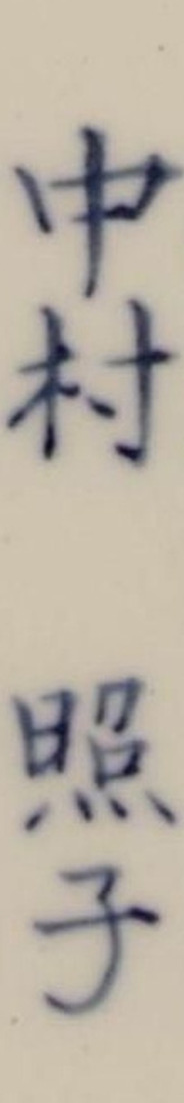中村照子
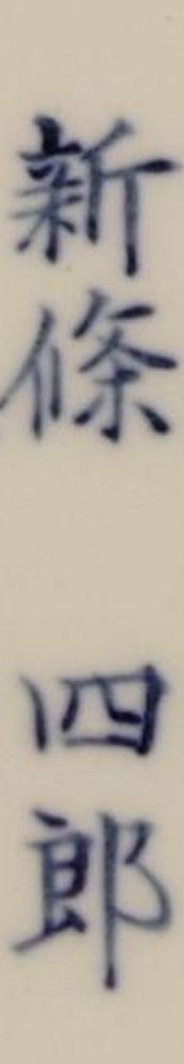新條四郎
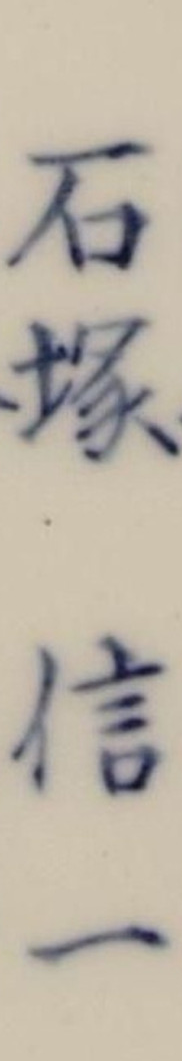石塚信一
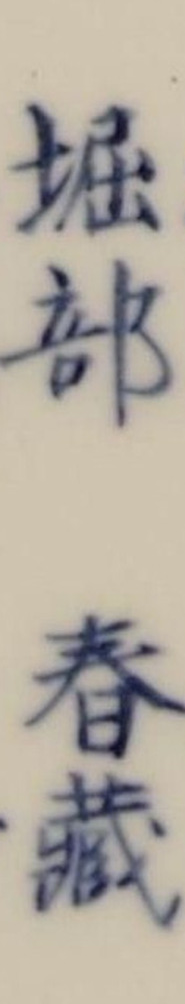堀部春蔵
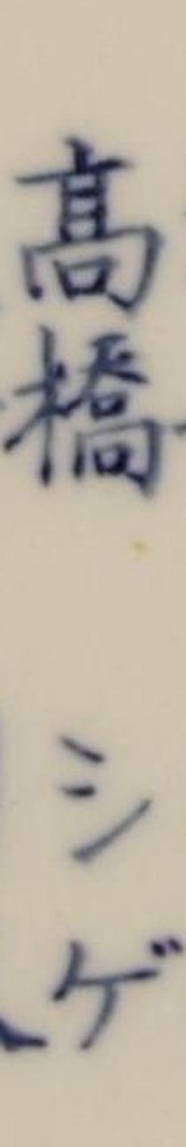高橋シゲ
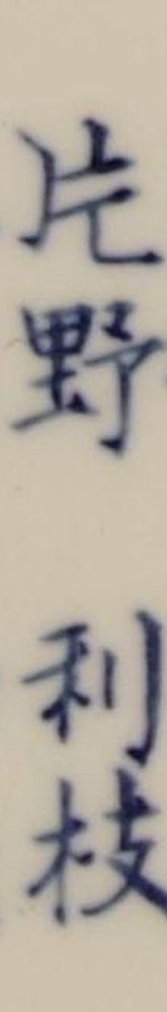片野利枝
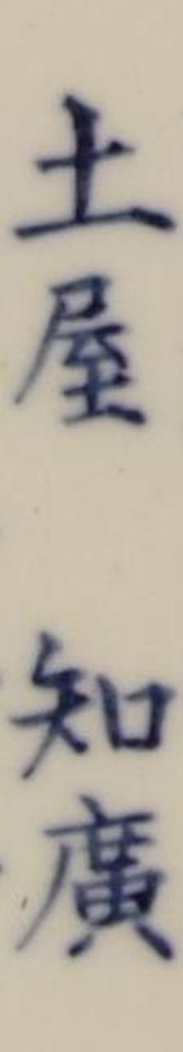土屋知廣
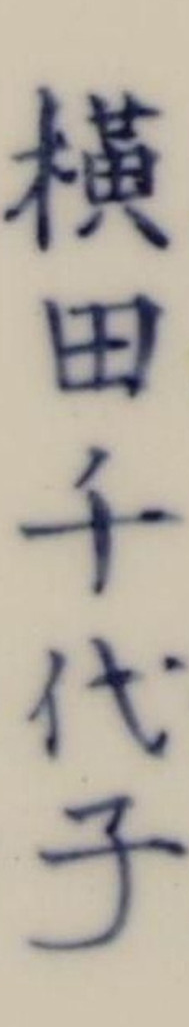横田千代子
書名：E~L
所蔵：高野山金剛峯寺
